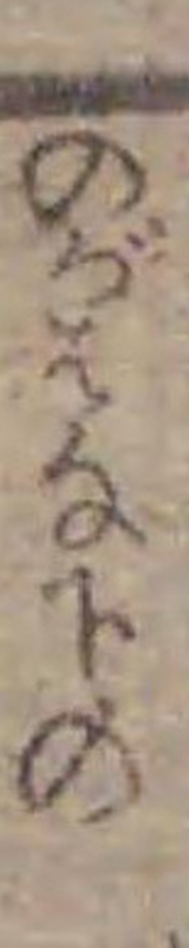のかはな下の
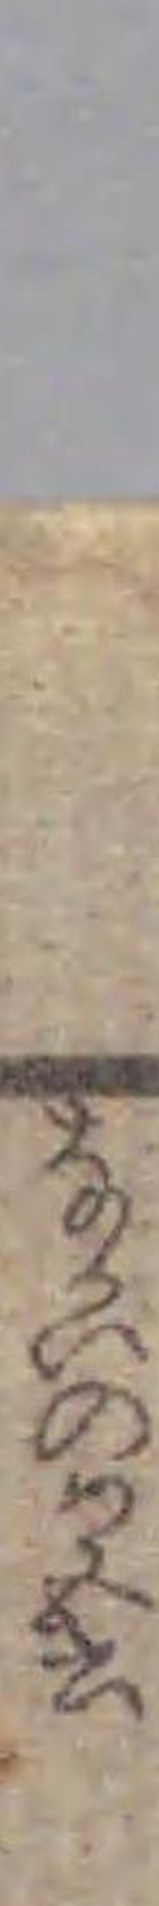なかいのか五六
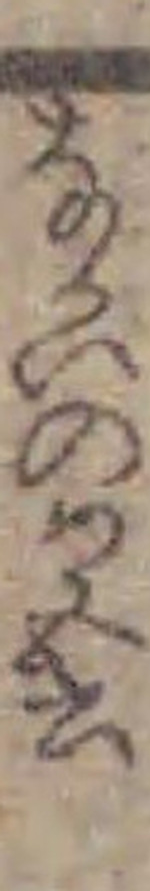なかいのか五六
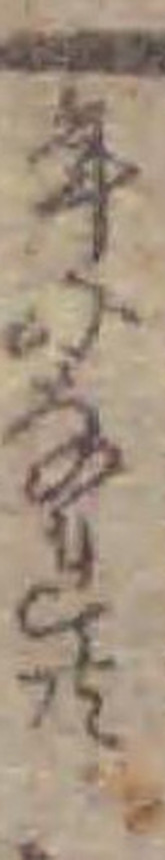年になれ共
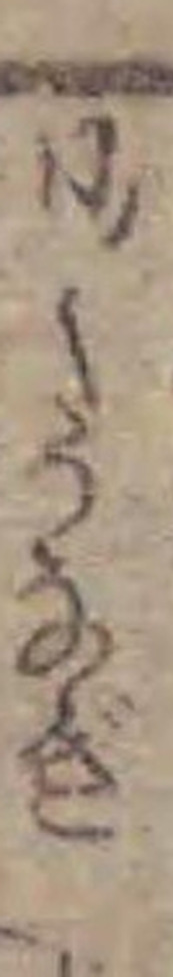日〳〵うなぎ
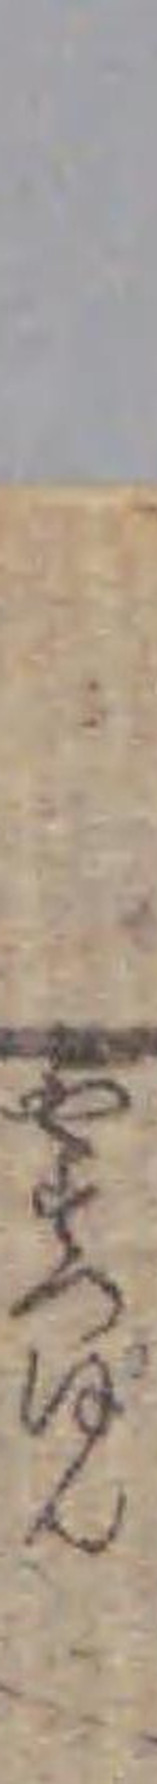やすつぽん
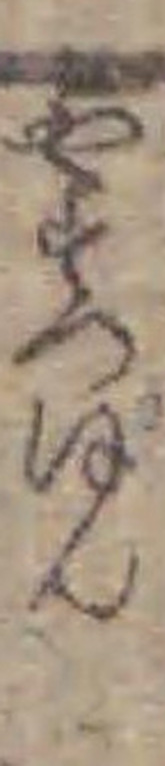やすつぽん
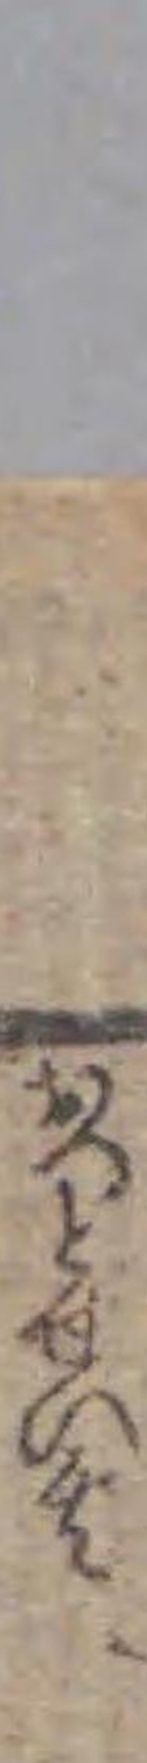おつとせい其
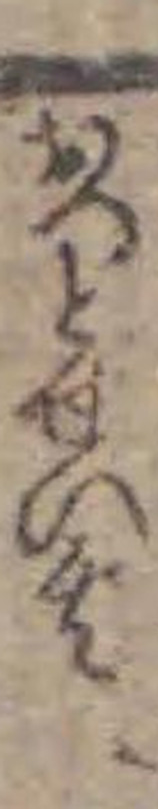おつとせい其
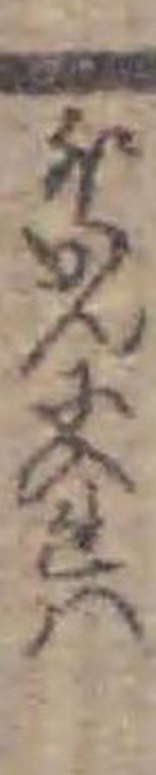外かんに入れは
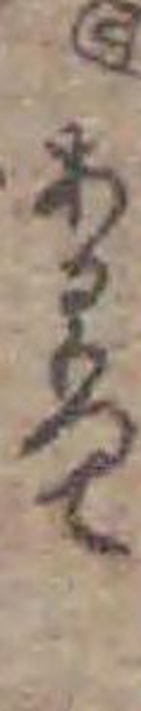あるもつて
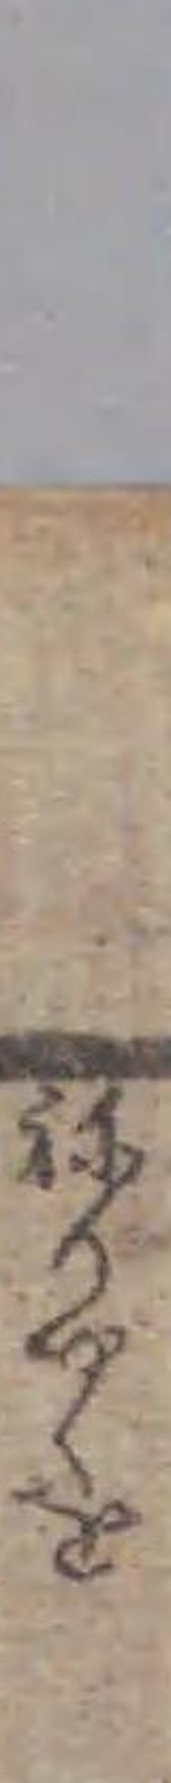ねりやくを
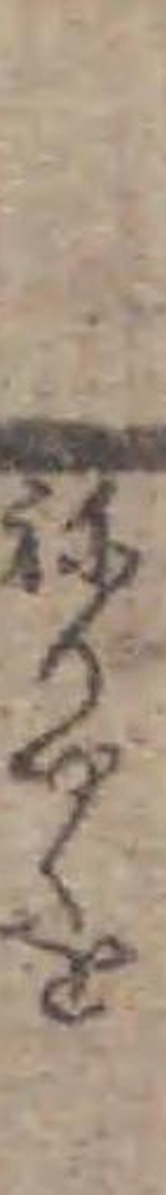ねりやくを
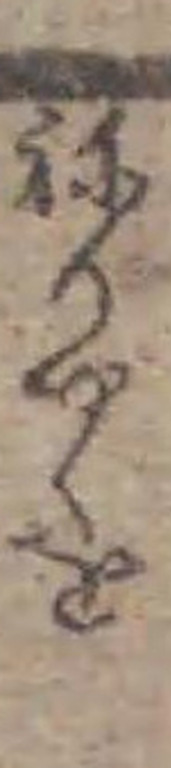ねりやくを
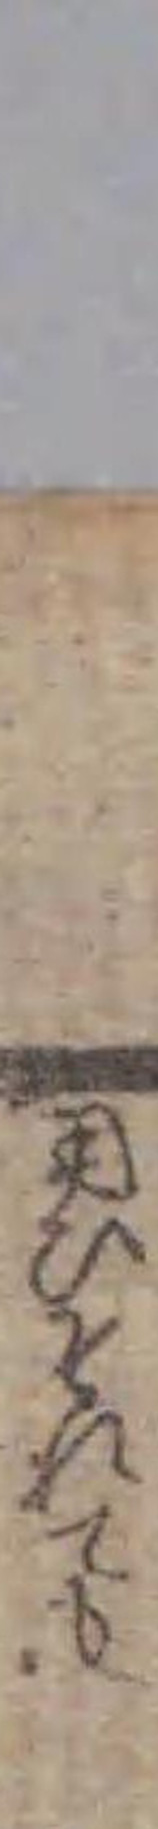用ひそれても
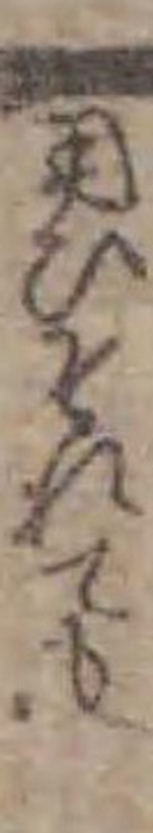用ひそれても
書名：通風伊勢物語 : 3巻
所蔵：国立国会図書館 National Diet Library, JAPAN
